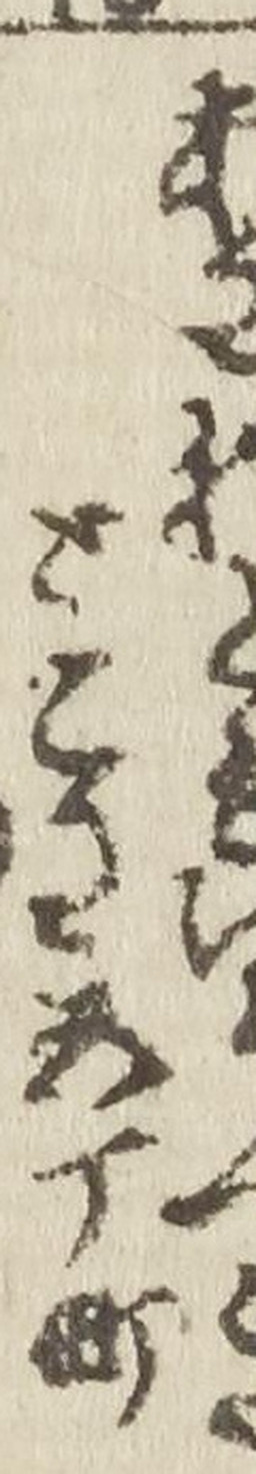とこわ五丁町
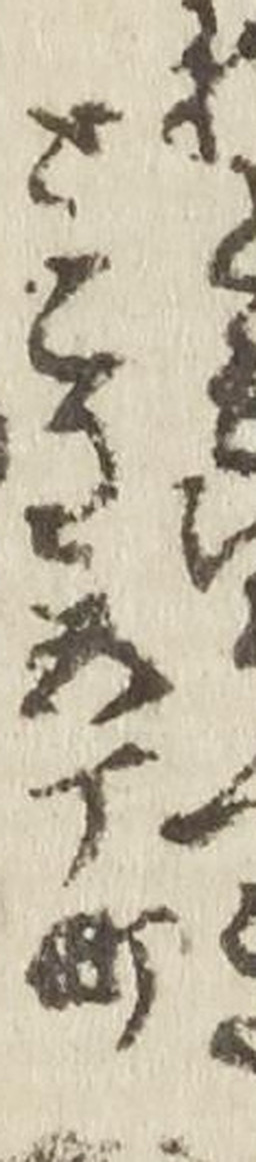とこわ五丁町
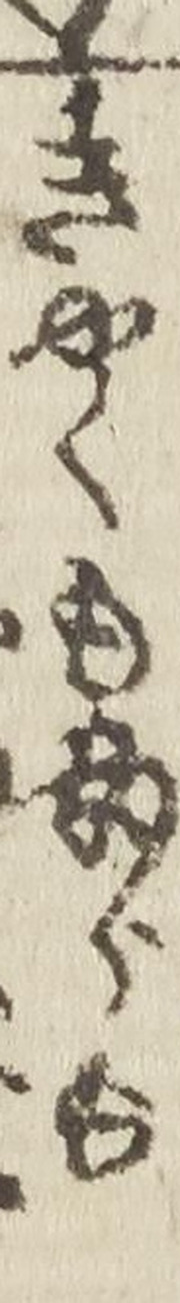きやくも女らも
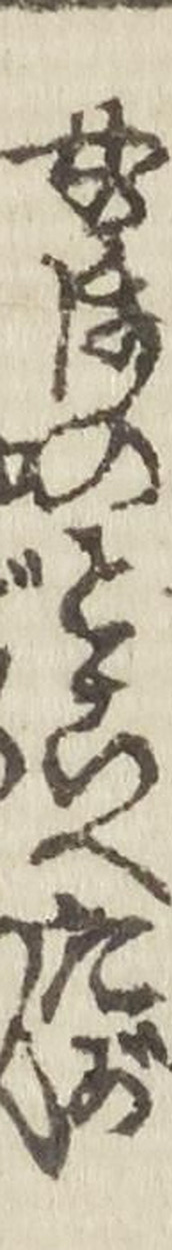女ほうのとこへたが
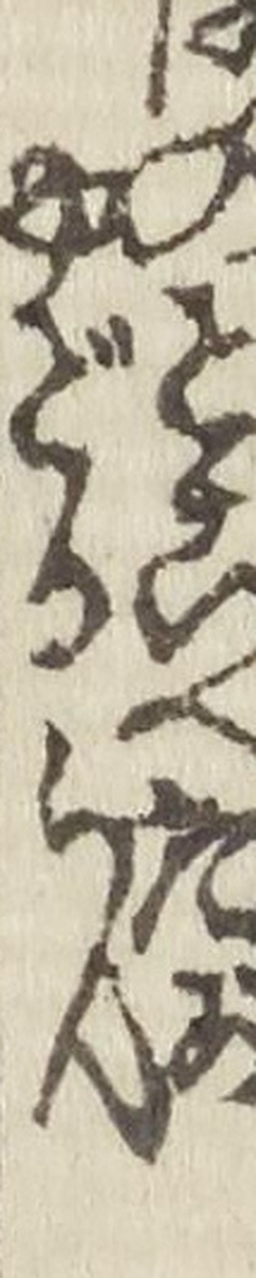やどるらん
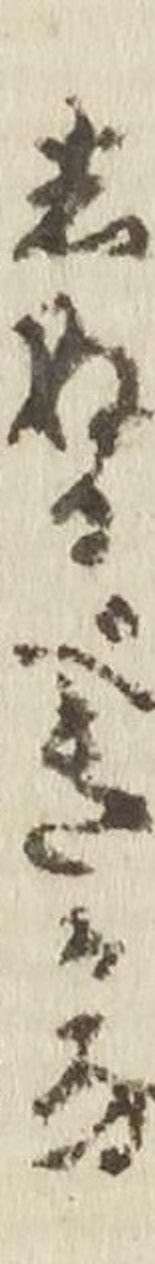しぬるべきかな
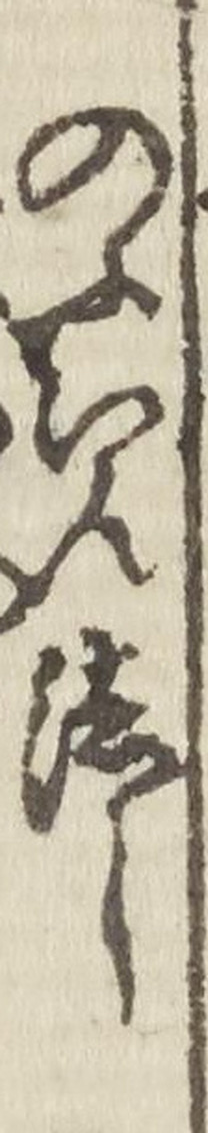のふいん法し
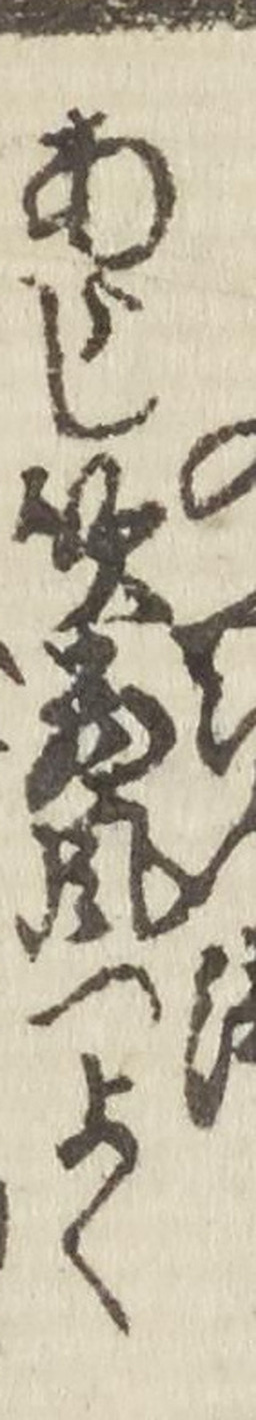あらし吹西風つよく
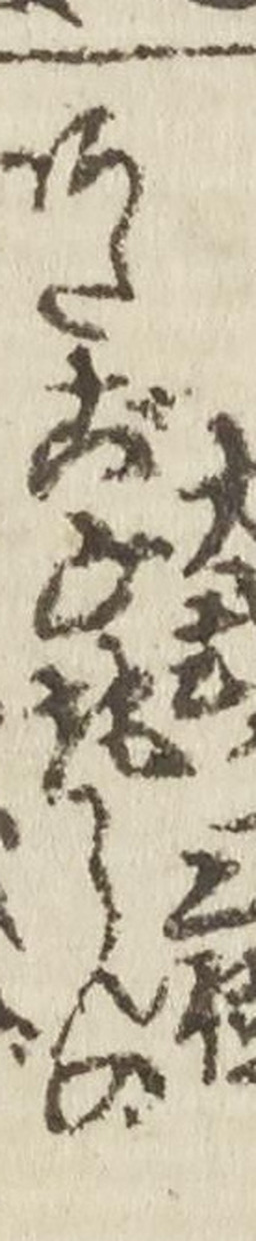あたご山地しんの
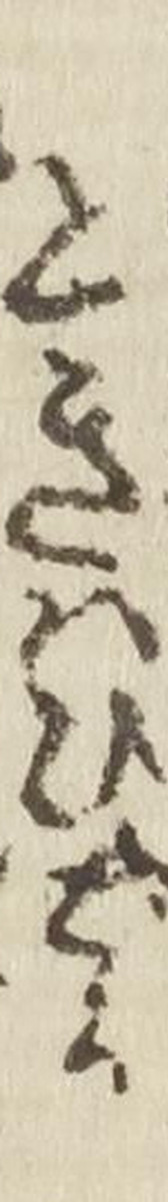ときはひとり
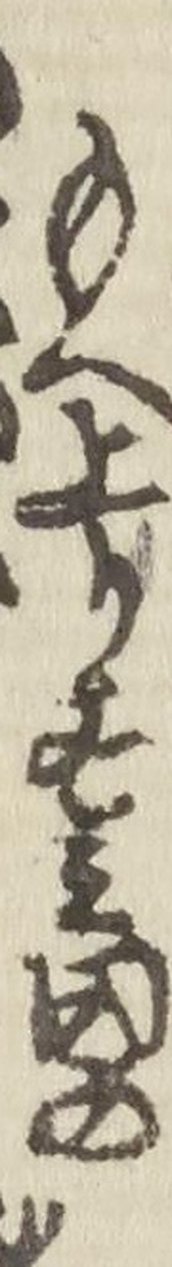もへ上りすみ田の
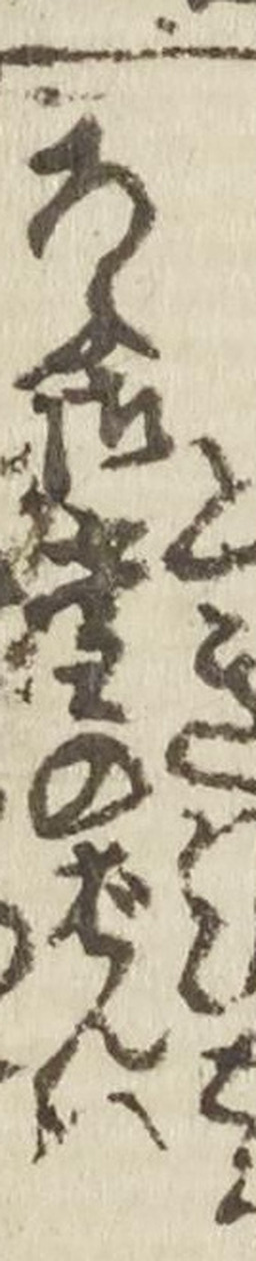なふ御堂のばんは
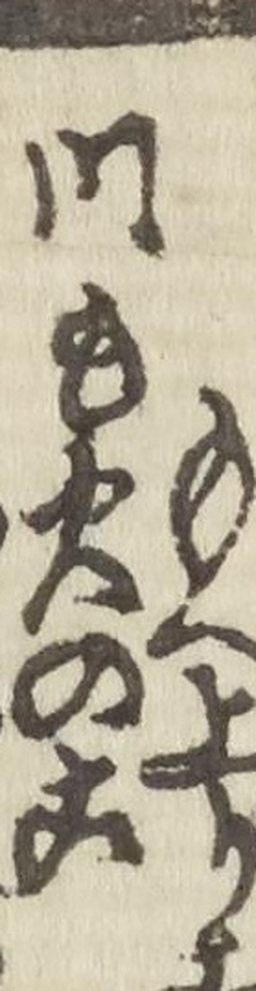川も火のこ
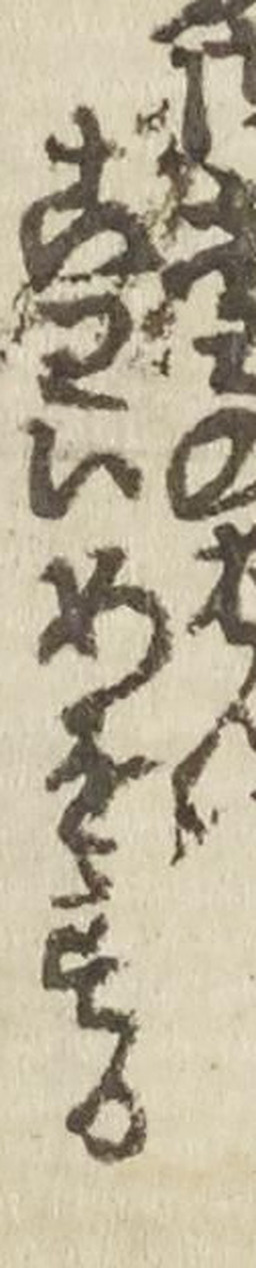こわいめをする
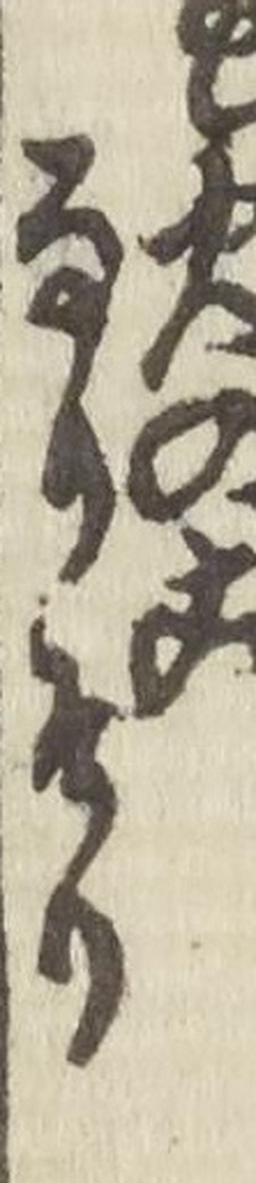なりたり
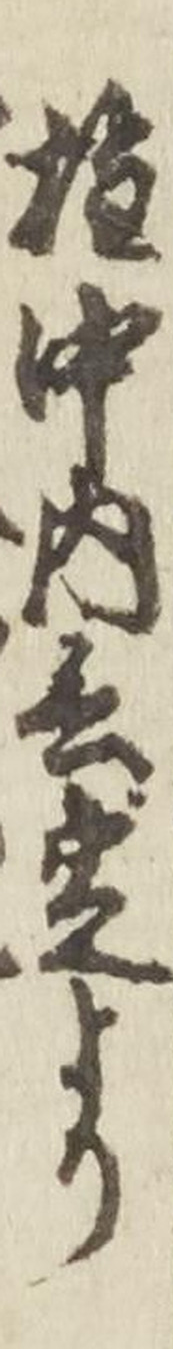権中内言定より
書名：しんぱん三十六哥仙
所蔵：東京大学地震研究所図書室 Earthquake Research Institute Library, The University of Tokyo, JAPAN
